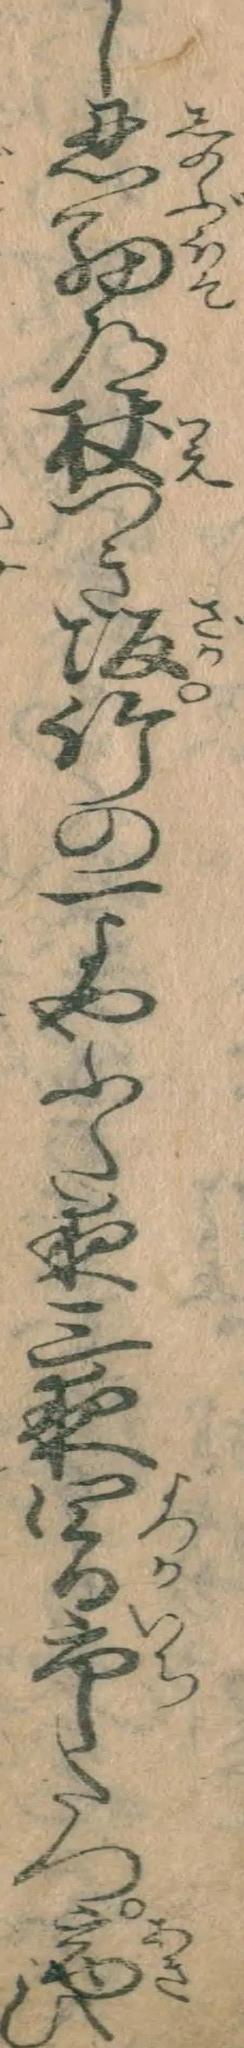し忍細道杖つき坂。竹の一よやふた夜三夜四日市たつ。商ひ
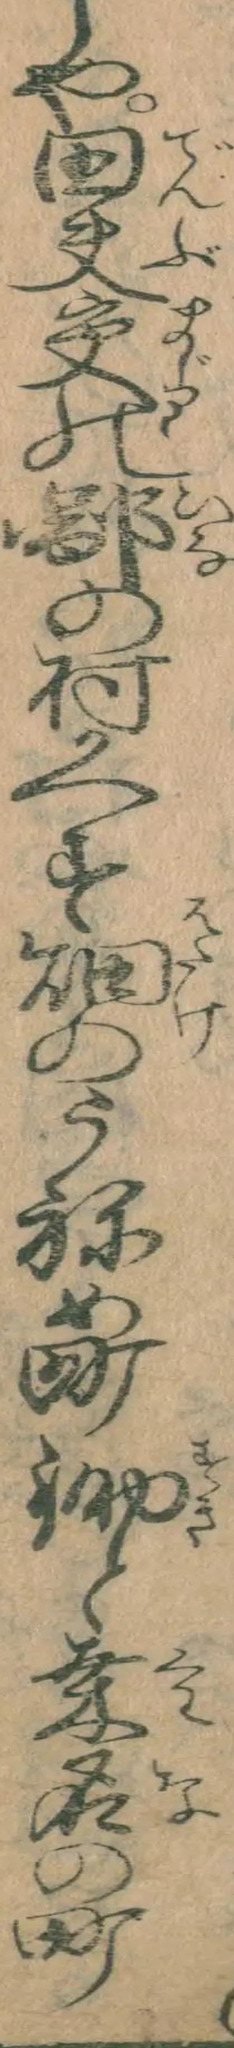とや。田夫交の鄙の村かへす畑のうねめ町鋤と桑名の町

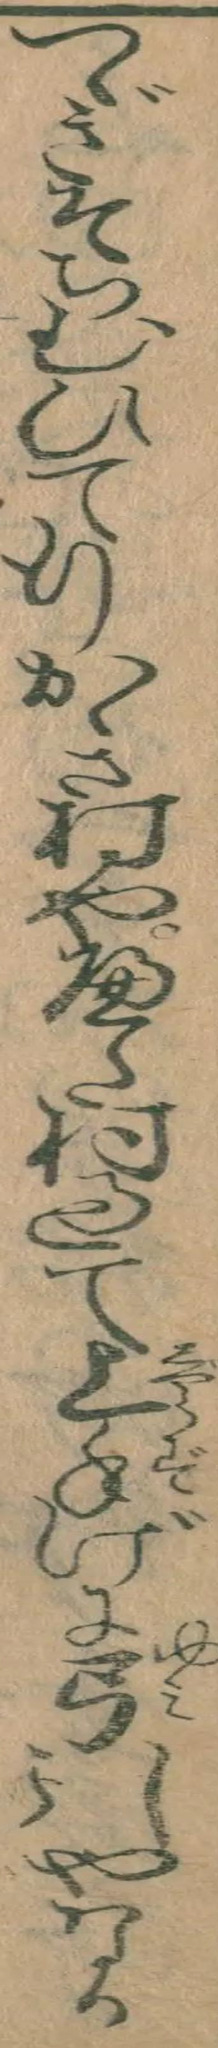つゞきそちむひて行かき村や。へた村過て上手げに弓引やなる
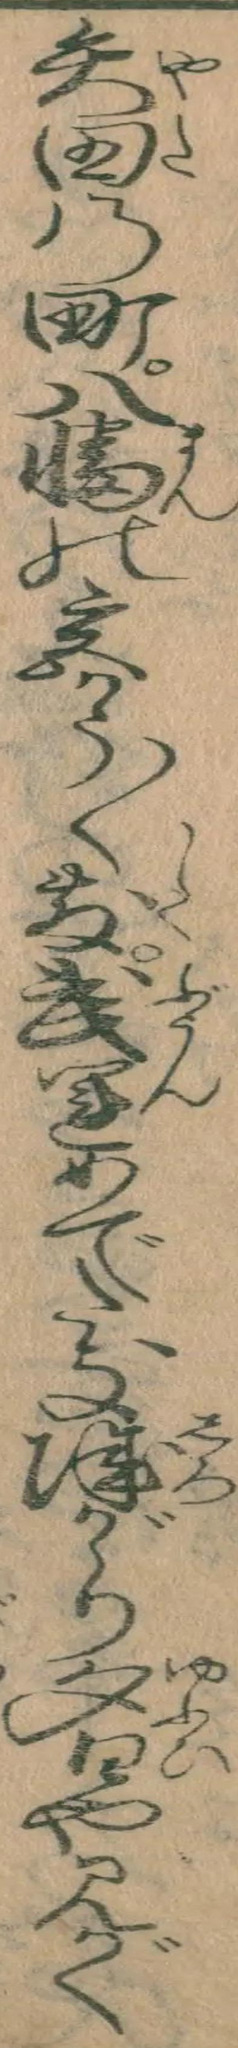矢田の町。八幡の宮かう〳〵敷。武運めでたき城がゝり夕日やみがく
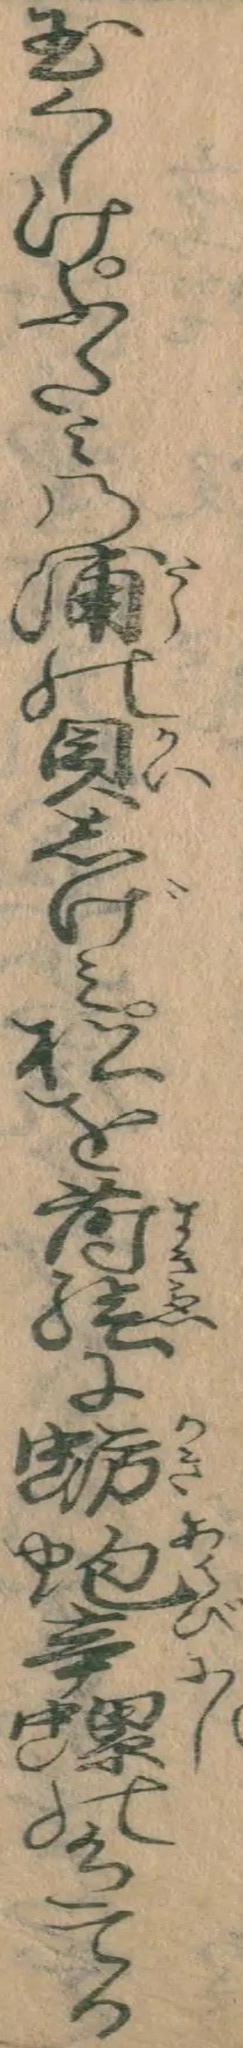玉くしけ。ふたみの浦の貝しげみ。松を蒔絵に蛎蚫辛螺の色てる
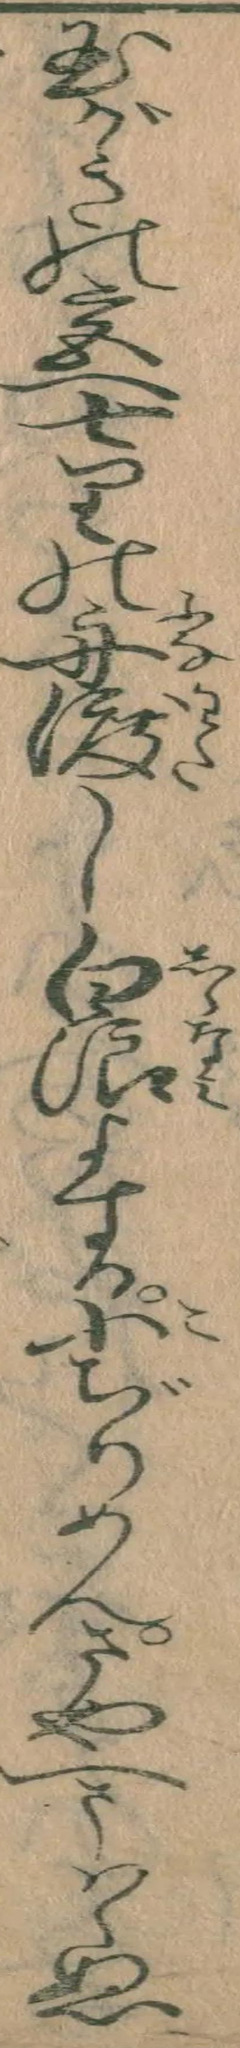玉がきの宮へ七里の舟渡し白浪よする。小ぢりめん。さやへまはらぬ
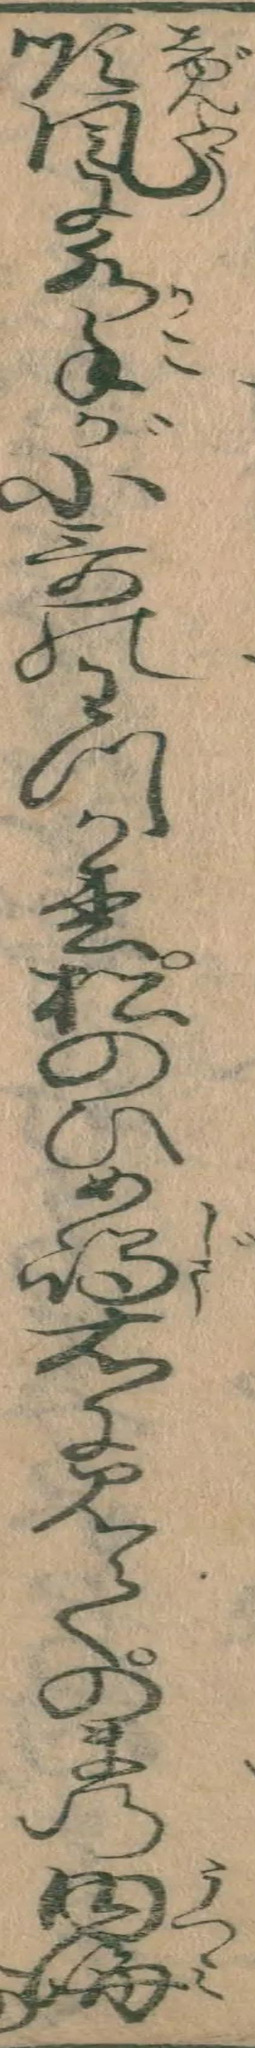順風に水手が小歌のわつか松。松のひめ島右に見て。のまの内海の
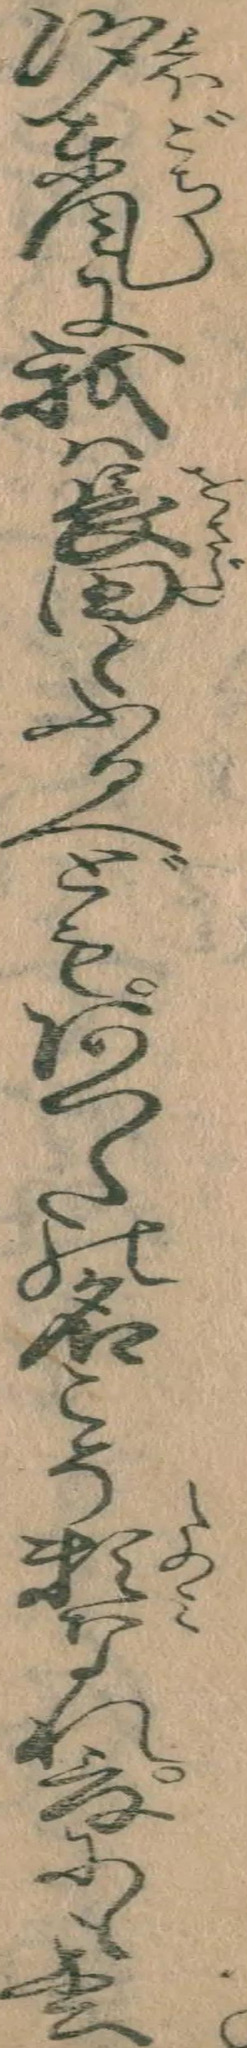汐東風に我は長田とふるへども。あつたの名こそ頼なれ。爰にも松
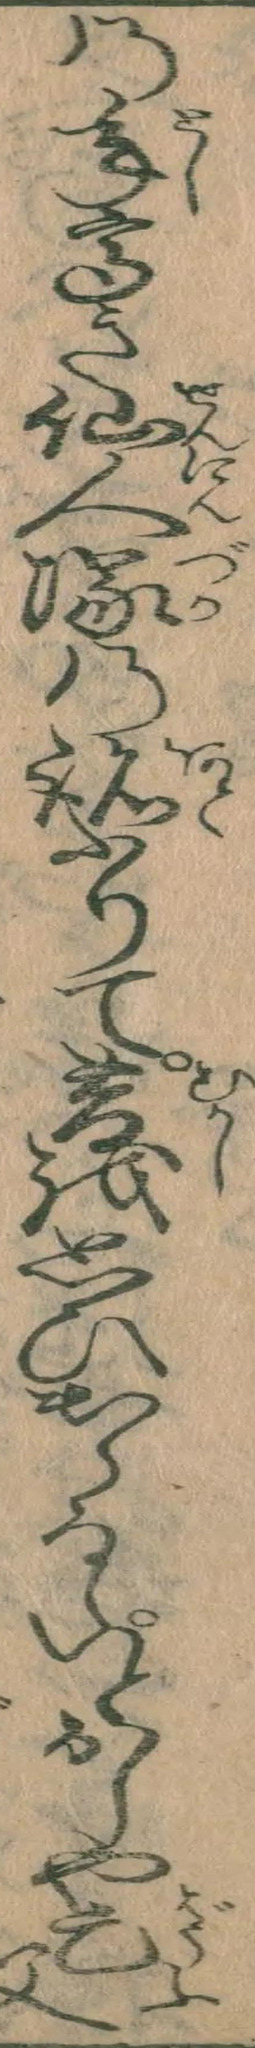の年高き仙人塚の跡ふりて。昔を思ひ出らるゝ。いとほしや亡父
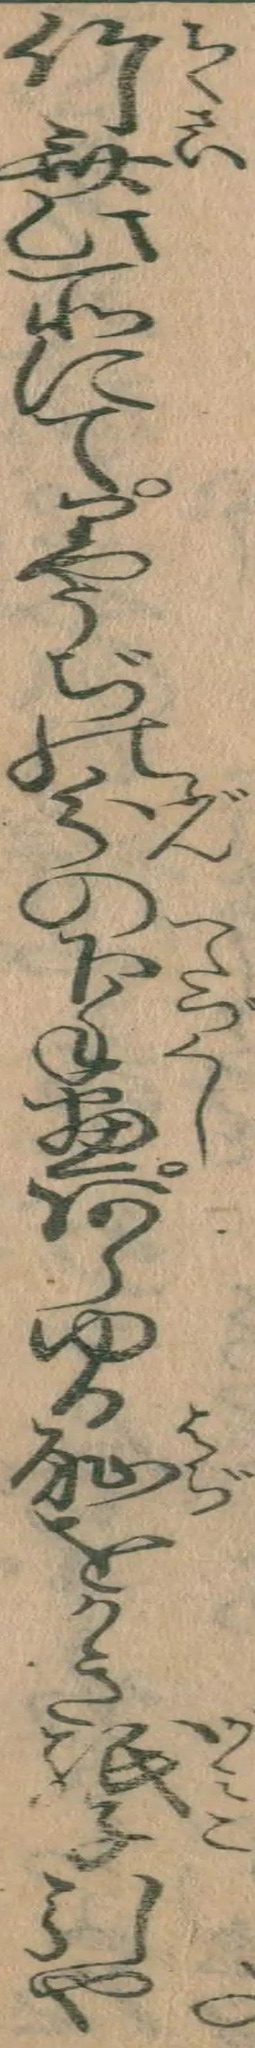竹斎此所にて。りやうぢの分の下手尽。あらゆる恥をかき紙子引や
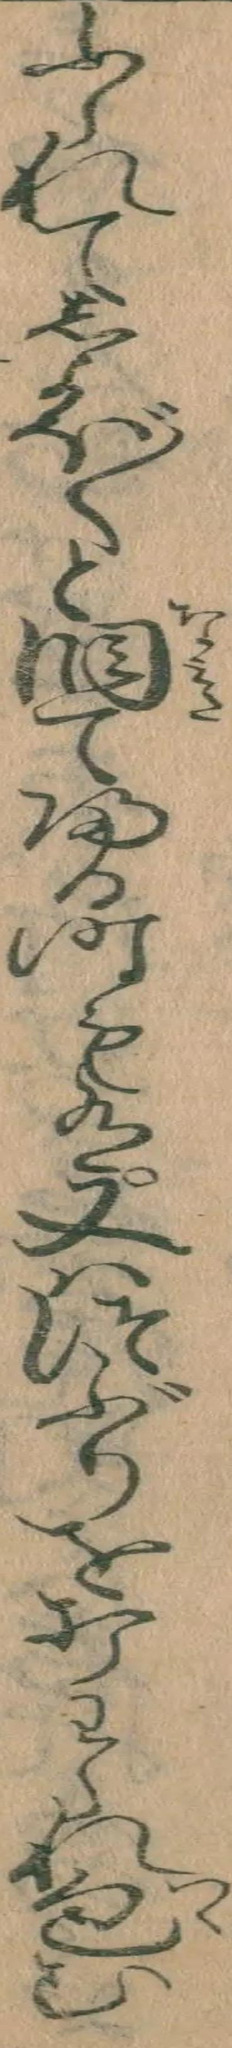ふられてしよぼ〳〵と泪て帰る時も有。又はつぶりを打わらられ包む
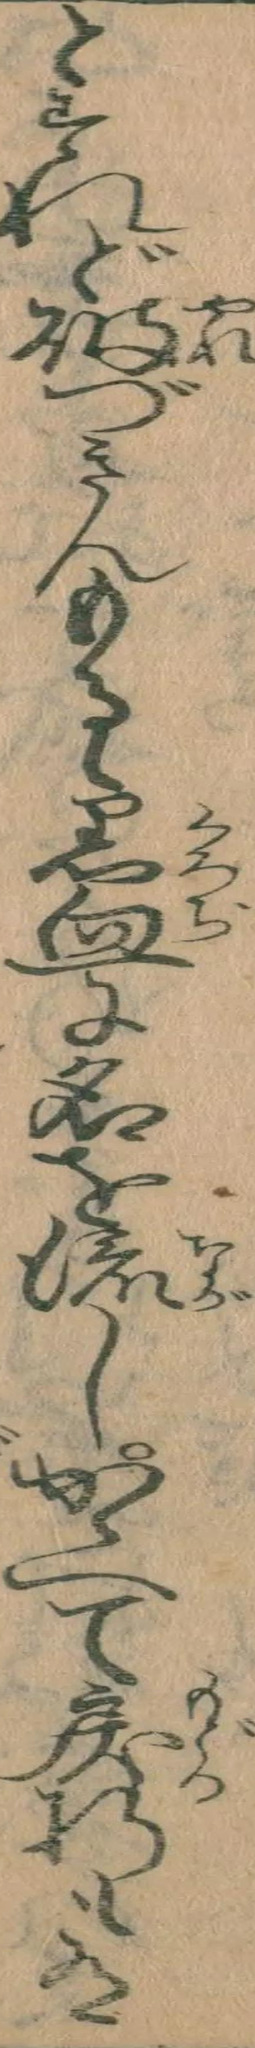とすれど破づきんもるゝ黒血に名を流し。かゝへて戾折も有
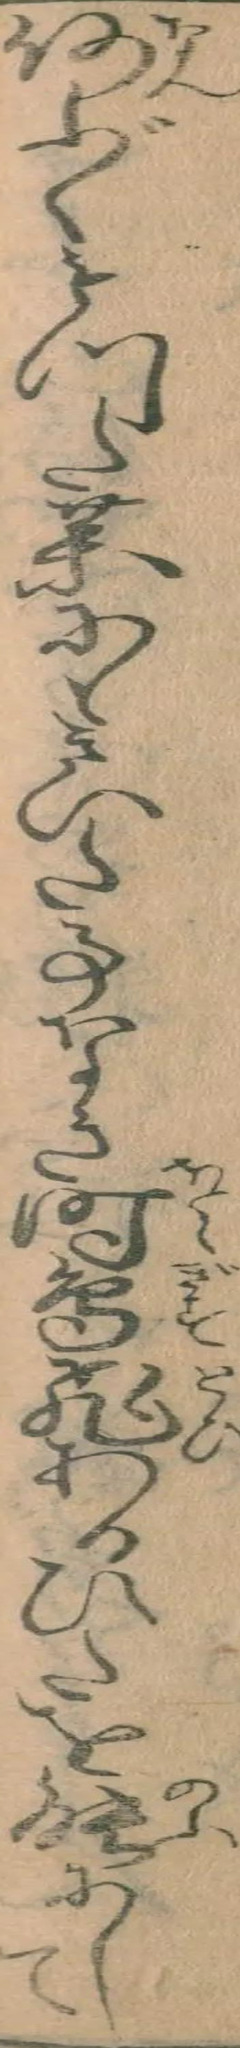何ぶくもつた薬にもきいた事なき時鳥飛あるひたを能にして
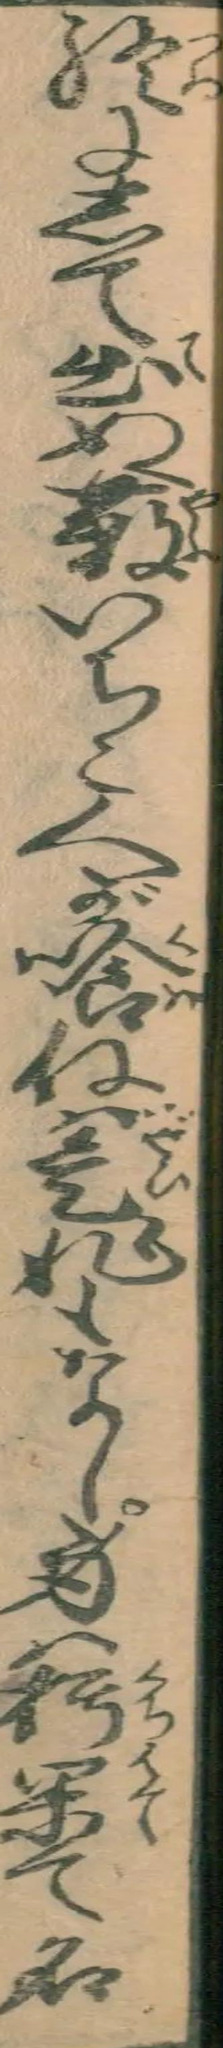終にして出ぬ薮いちこ人が喰ねば是非もなし。身は朽果て名
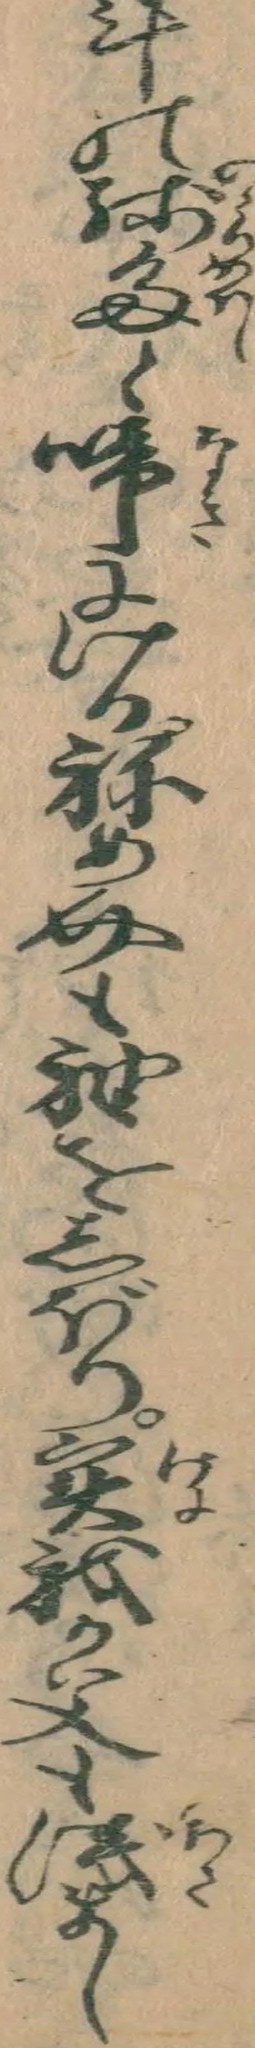計の残多と啼にける。ねめ介も袖をしぼり。実我か父浅まし
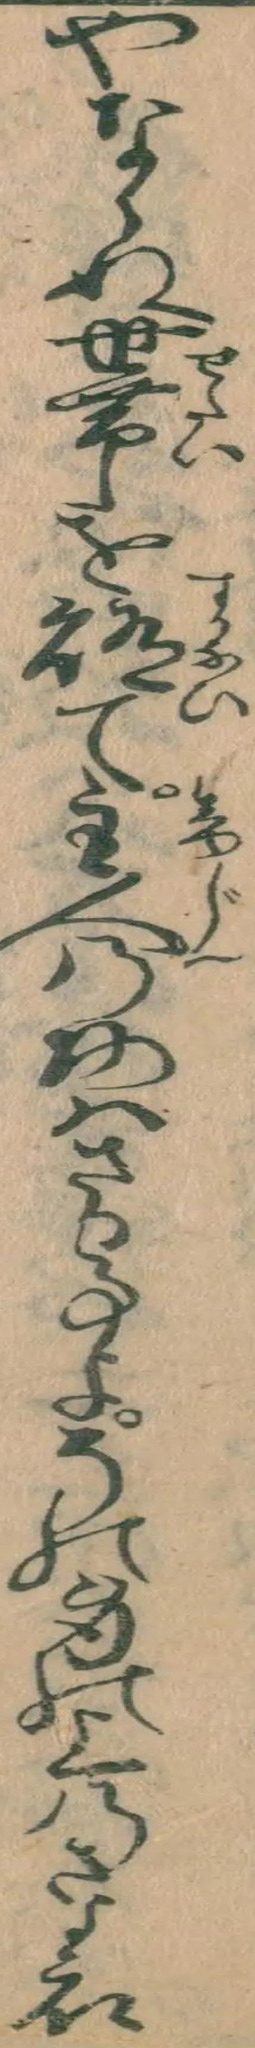やならぬ世帯を賄て。主人の物はさる事よ。その身の上のさよ衣
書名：新竹斎 5巻
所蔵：国立国会図書館 National Diet Library, JAPAN
